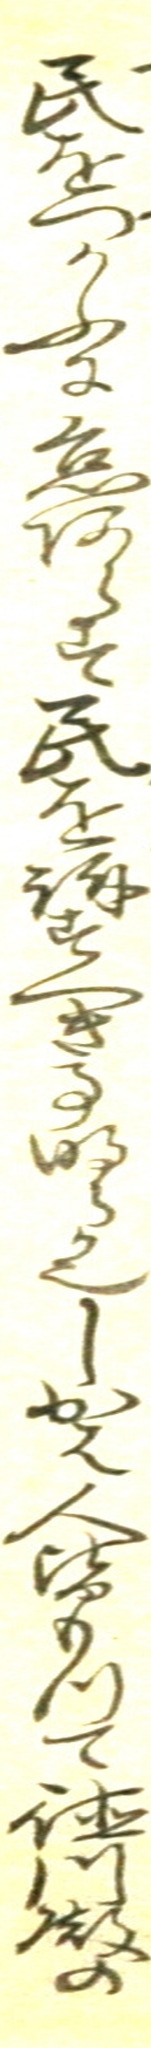民をつかふに怠あらす民を訴すへき事明らか也しかは人皆もつて徳川殿の
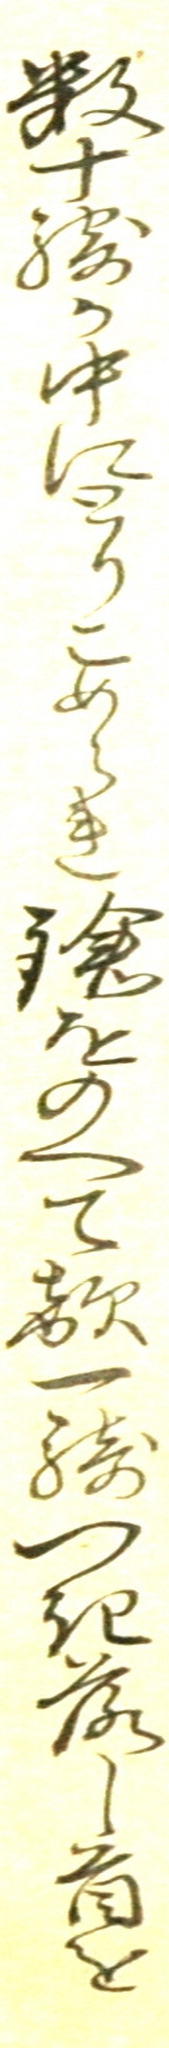数十騎か中にとりこめられ鎗をのへて敵一騎つき落し首を

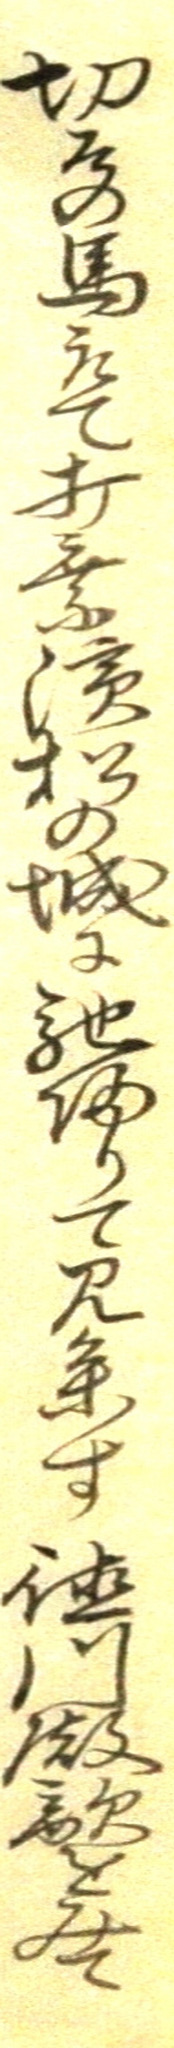切その馬取て打乗浜松の城に馳帰りて見参す徳川殿敵をみて
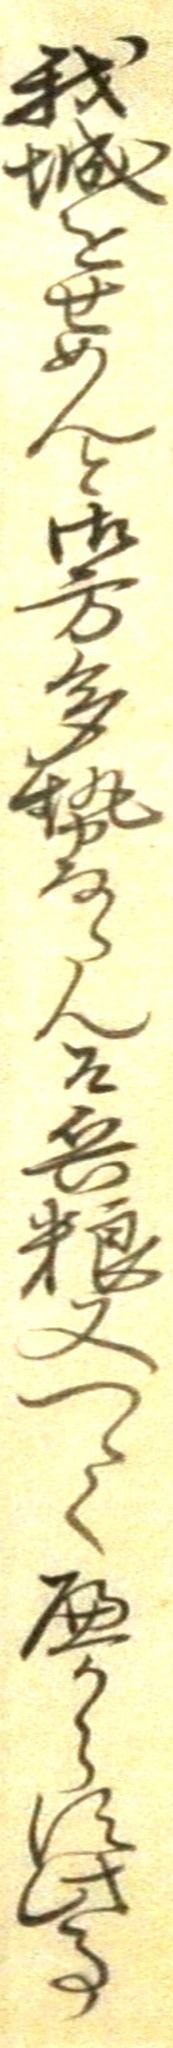我城をせめんと御方多勢ならんそ兵粮又つゝくへからす此事
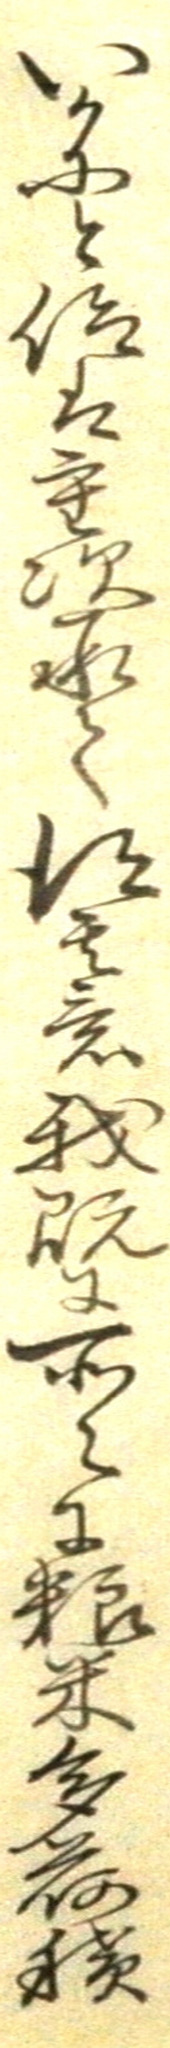いかにと仰は重次承て得其意我既に所々に粮米多荷積
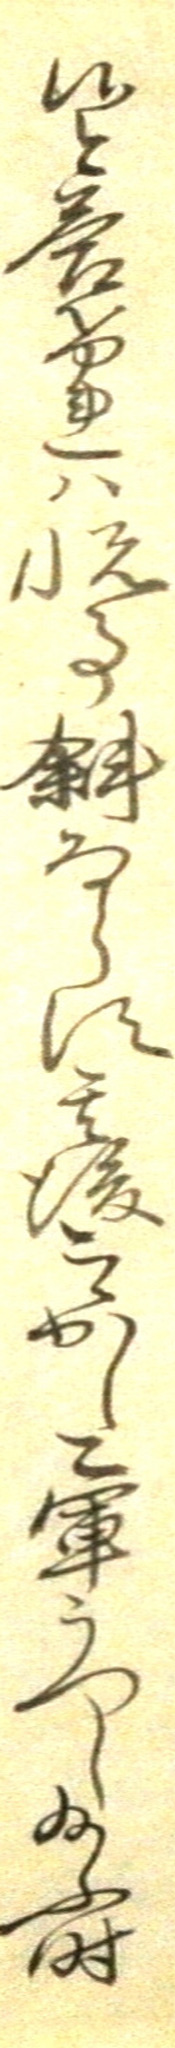候と答けれは悦事斜ならす其後こゝかしこ軍うつし給ふ時
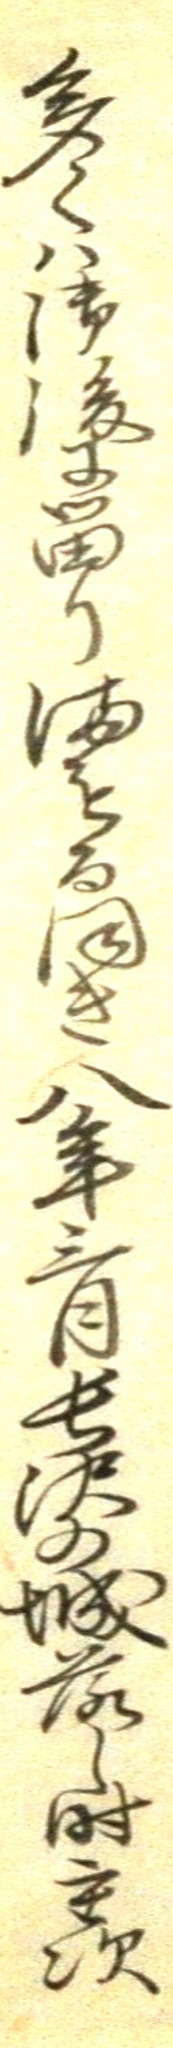多くは御後に留りまもる同き八年三月長沢の城落し時重次
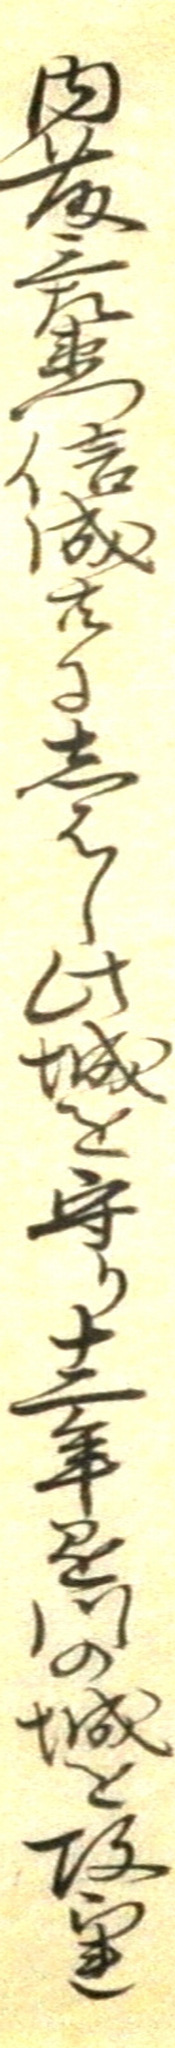内藤三左衛門信成共にしはし此城を守り十二年懸川の城を攻られ
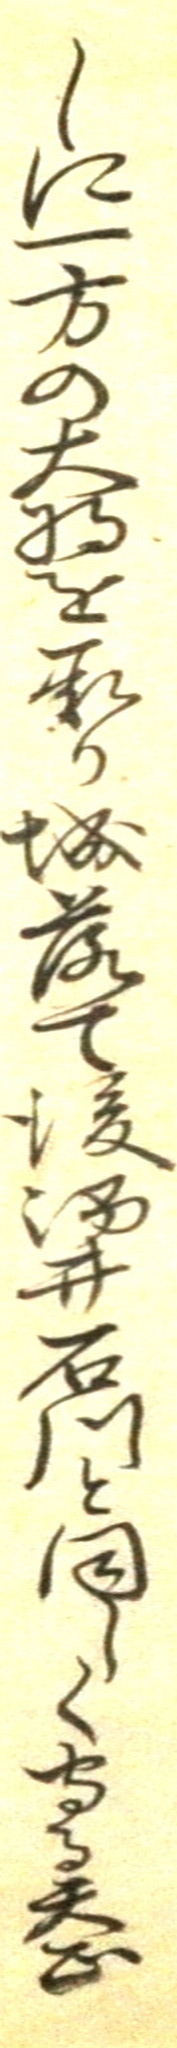しに一方の大将を承り城落て後酒井石川と同しく守る天正
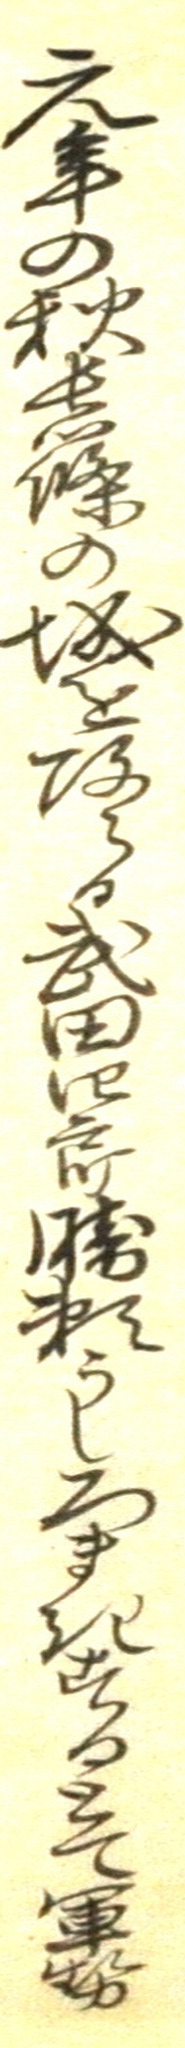元年の秋長篠の城を攻らる武田四郎勝頼うしろまきするとて軍勢
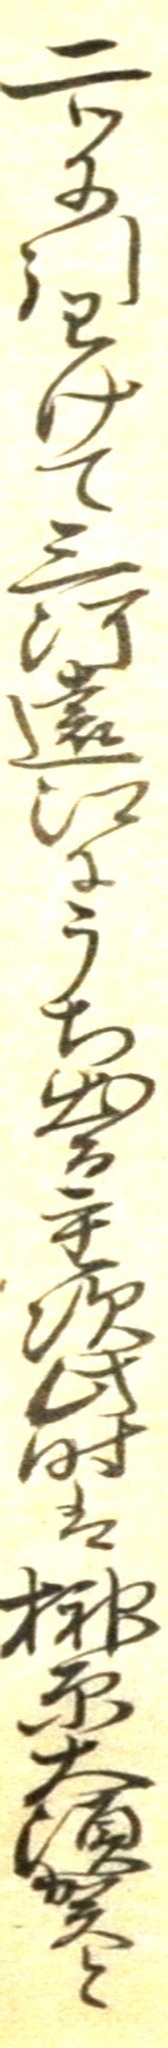二ッに引わけて三河遠江にうち出る重次此時は榊原大須賀と
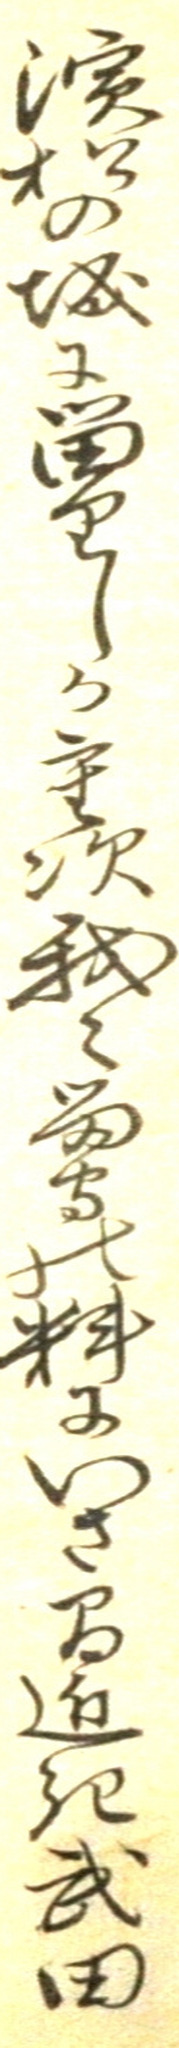浜松の城に留りしか重次我々留守の料にいさ間近き武田
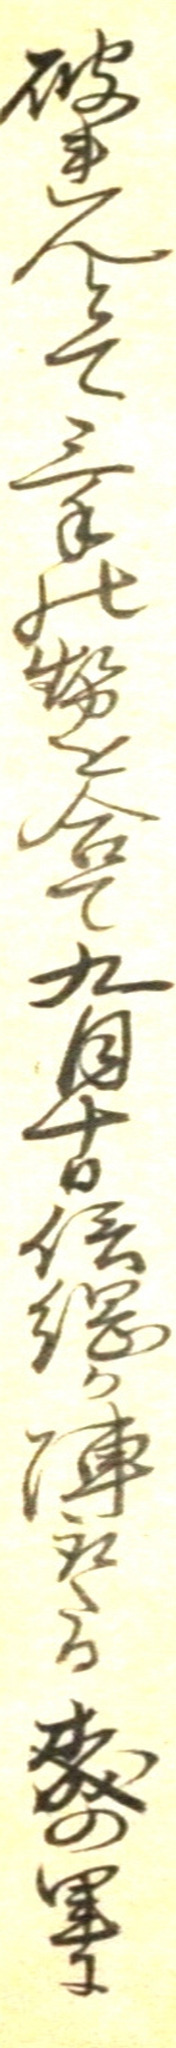破れんとて三手の勢を合て九月十日信綱か陣取たる森の軍に
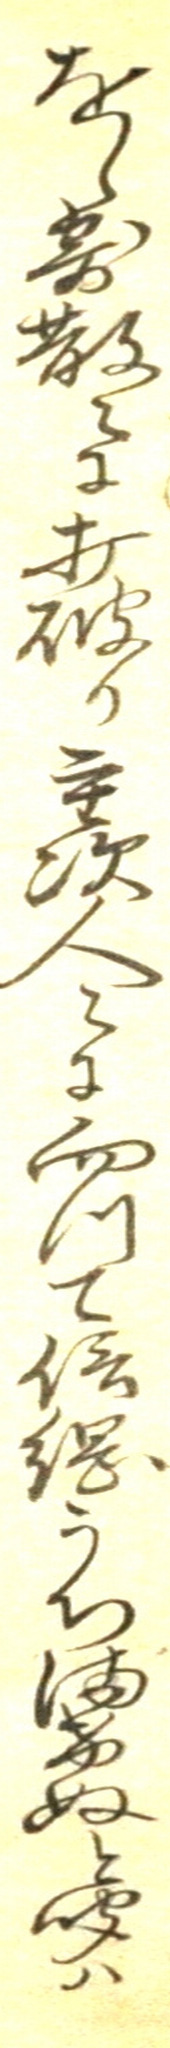をし寄散々に打破り重次人々に向つて信綱うちまけぬと聞は
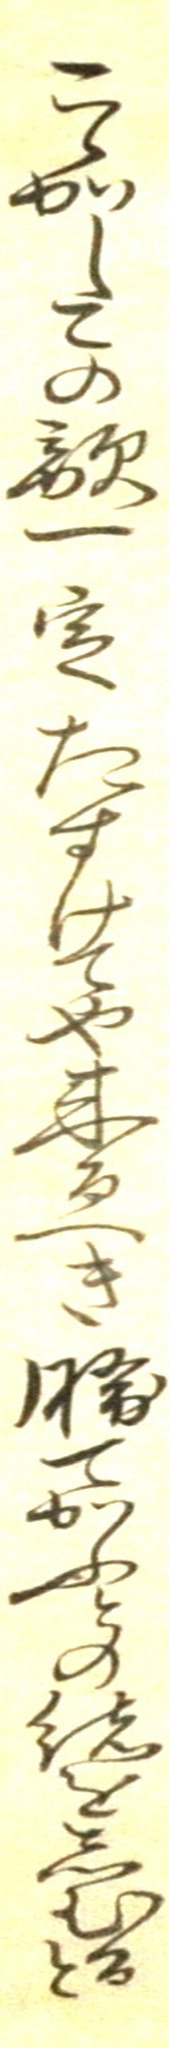こゝかしこの敵一定たすけてや来るへき勝てかふとの緒をしむると
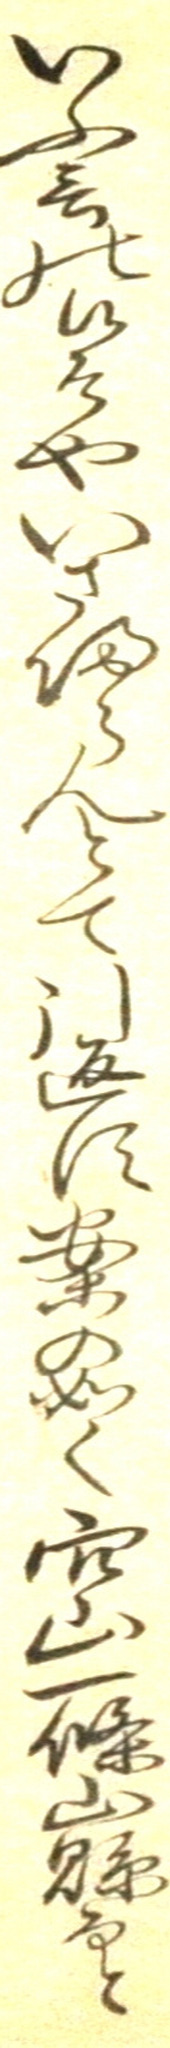いふ言の候そやいさ帰らんとて引返す案の如く穴山一条山縣なと
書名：藩翰譜（四・上）
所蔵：伊那市立高遠町図書館・合同会社AMANE
